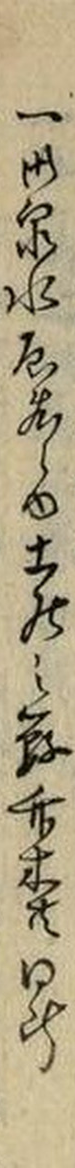一御泉水屋敷之内土居之藪竹木共同断
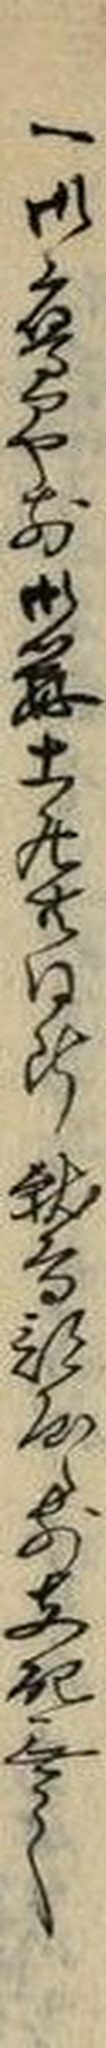一御鷹部や前御藪土居共同断鷲部屋之前支配無之
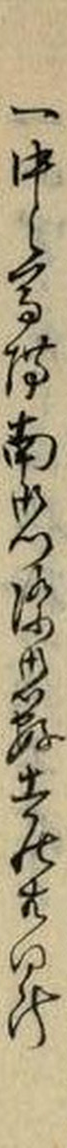一中之馬場南御門際御藪土居共同断
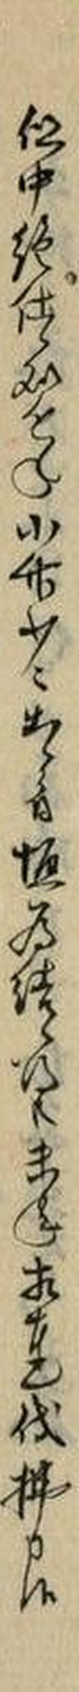但中絶仕候処近年小竹少々出候に付垣為結候得共未年相達伐払申候
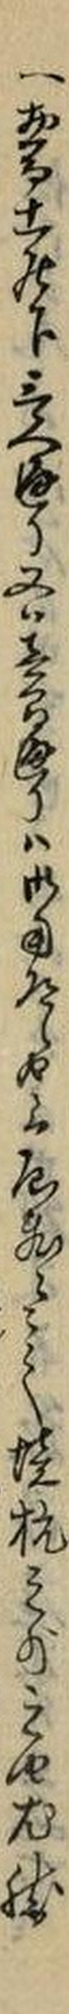一惣て土居下三尺通り又は壱間通りは御用道之由にて屋敷々々之境杭之外之由尤勝
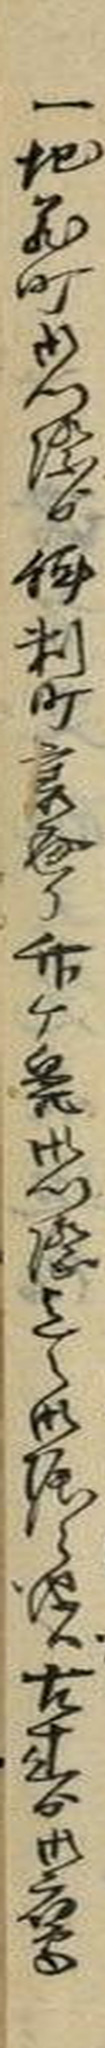一地蔵町御門際ゟ餌刺町裏通り竹ケ鼻御門際迄之御堀之儀は古来ゟ御鷹
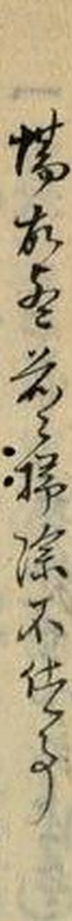場故歟前々掃除不仕候事
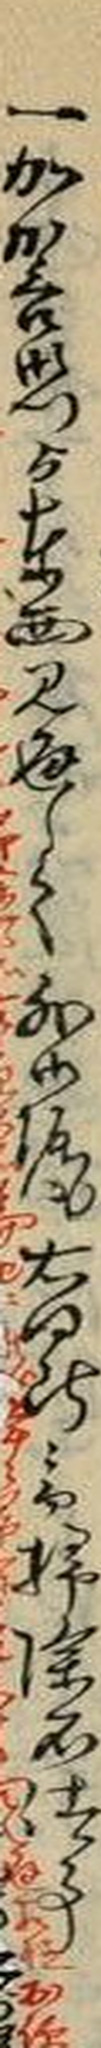一加賀口御門ゟ東西見通し之外御堀も右同断にて掃除不仕候事
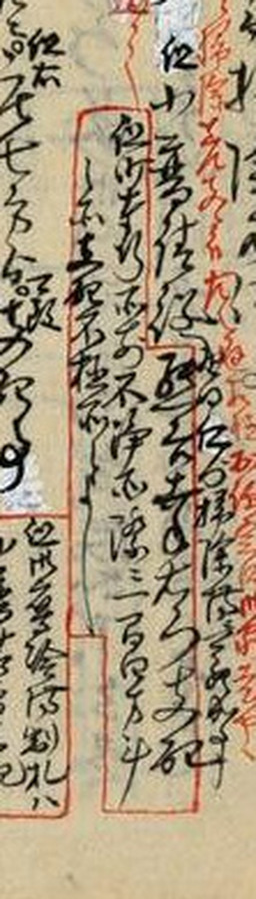但町奉行所前不浄所際に一間四方斗
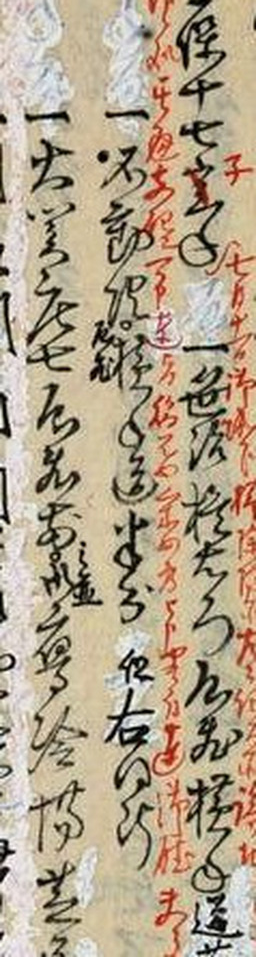一不動院屋敷横手道半分但右同断
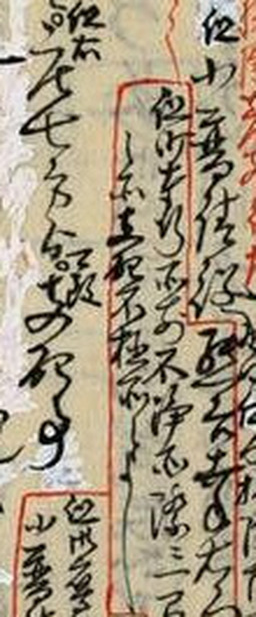之所支配不極所之よし
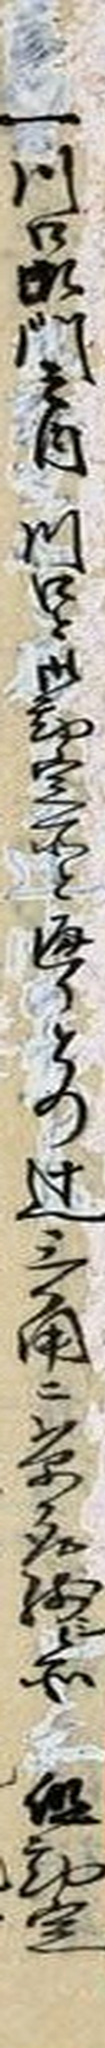一川口御門之内川口と御勘定所と通りとの辻三角に草取残シ候所但勘定
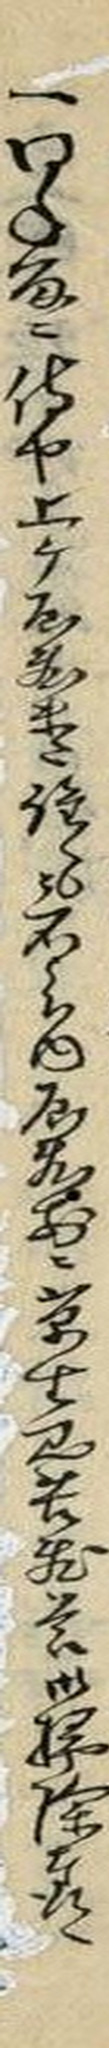一同年留に侍中上ケ屋敷未た誰へも不被下内屋敷前に草生見苦敷節御掃除奉行へ
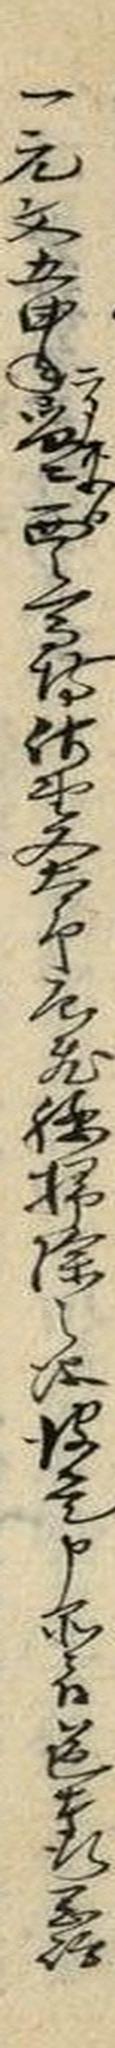一元文五申年二月廿五日西之馬場佐野又太郎屋敷腰掃除之儀彼是申所に付道奉行岡島
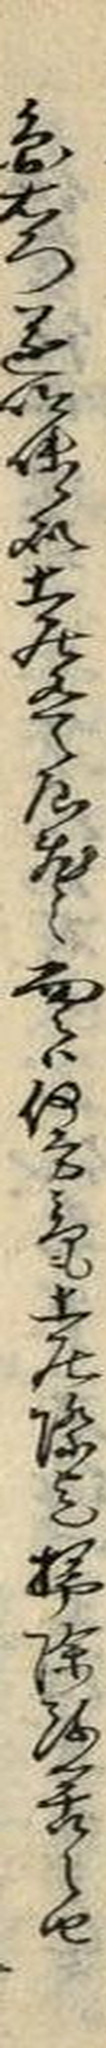円右衛門遂吟味候処土居有之屋敷之面々は何方にても土居際迄掃除致筈之由
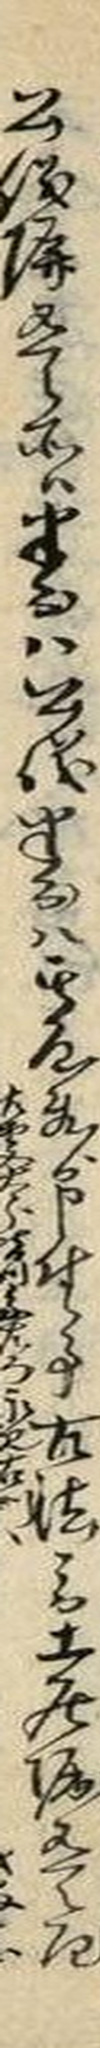公儀塀有之所は半分は公儀半分は其屋敷ゟ申付候事古法にて土居堀有之屋
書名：御城下諸事之部
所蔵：福井県文書館 Fukui Prefectural Archives
